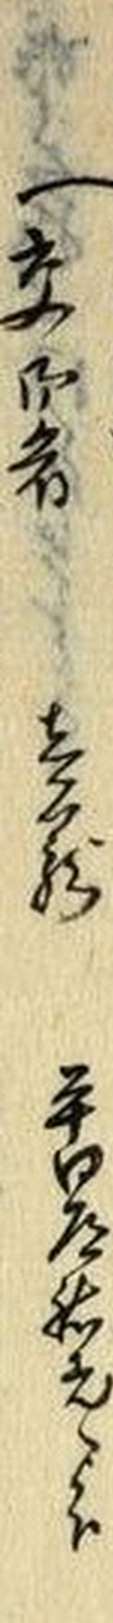交御肴壱籠平田道祐老へ被下
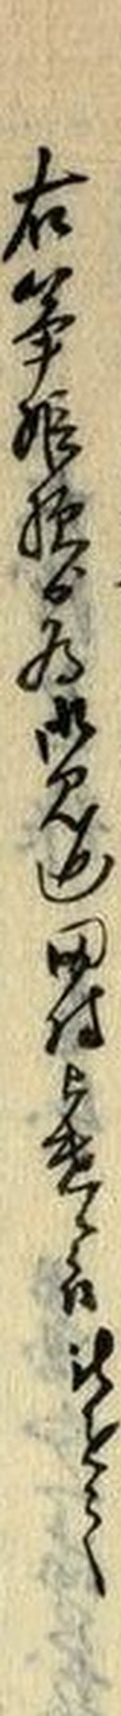右箏姫様ゟ為御見廻田村被遣候付ニ被進之
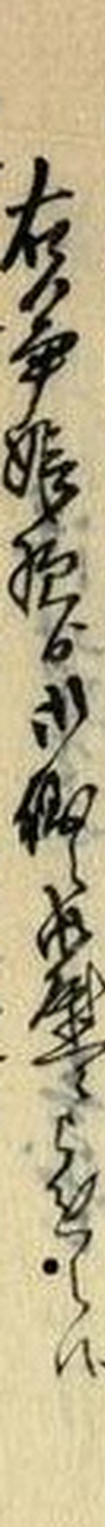右箏姫様ゟ御側之御慰ニ被進之候
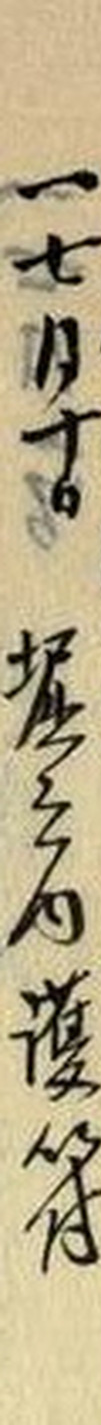一七月十日堀之内護符
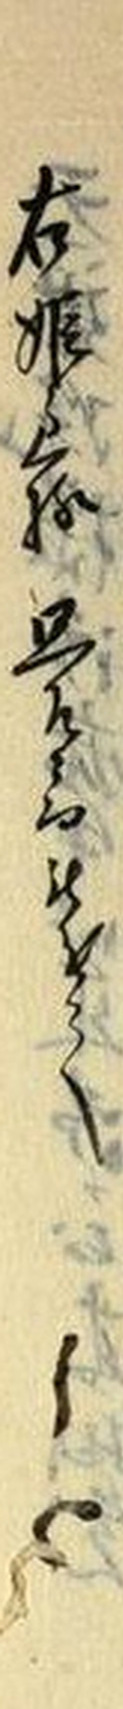右姫君様思召ニ而被進之
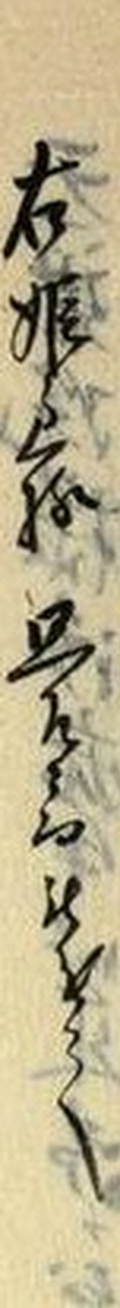右姫君様思召ニ而被進之
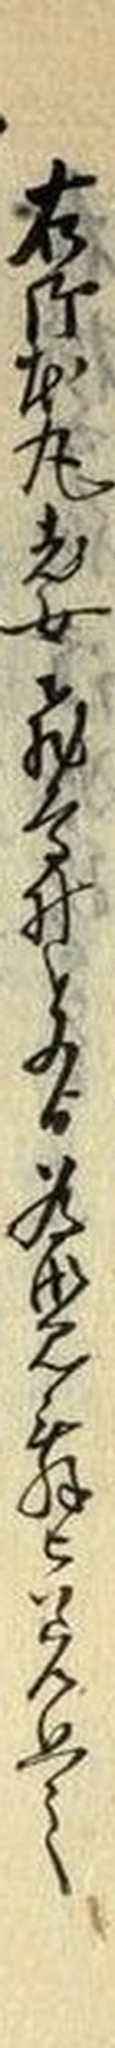右御本丸老女飛鳥井とのゟ為御見舞被差上之
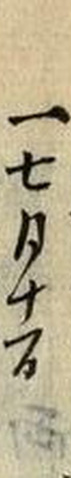一七月十一日
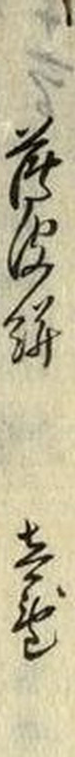薄皮餅壱台
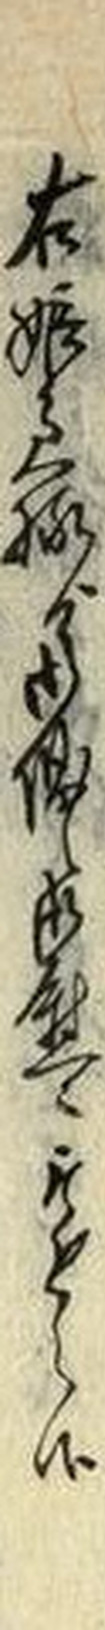右姫君様ゟ御側之御慰ニ被進之候
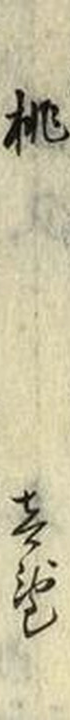桃壱台
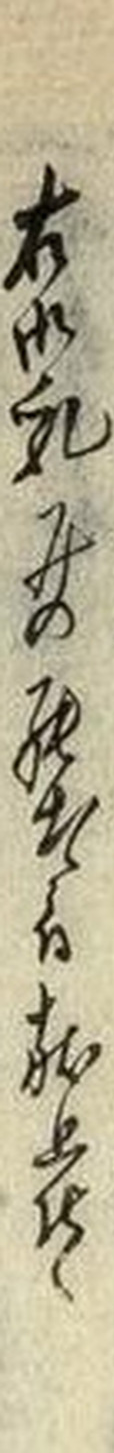右御乳みの罷出候ニ付献上仕候
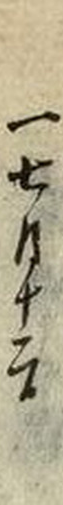一七月十二日
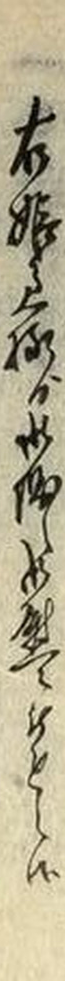右姫君様ゟ御側之御慰ニ被進之候
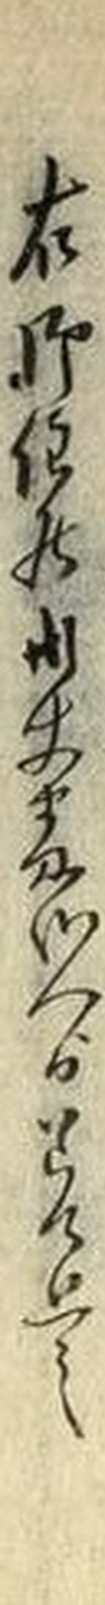右御住居御使番弐人ゟ差上之

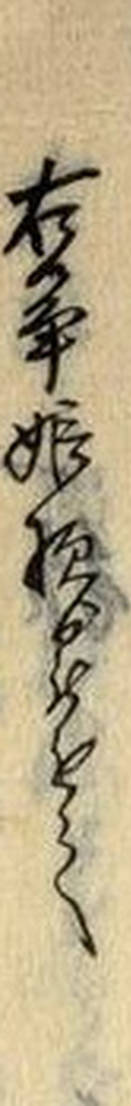右箏姫様ゟ被進之
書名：少傅日録抄（斉承付側向頭取日記、在府）
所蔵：福井県文書館 Fukui Prefectural Archives
